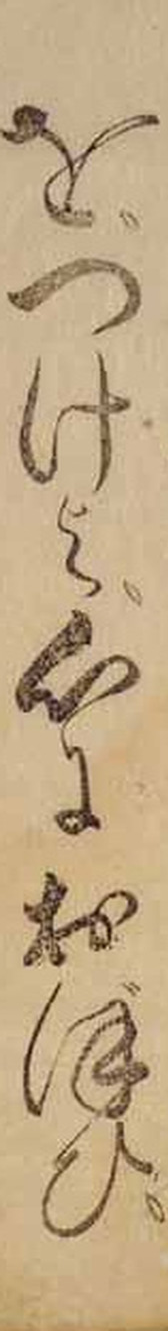をつけよ。心におほひ。
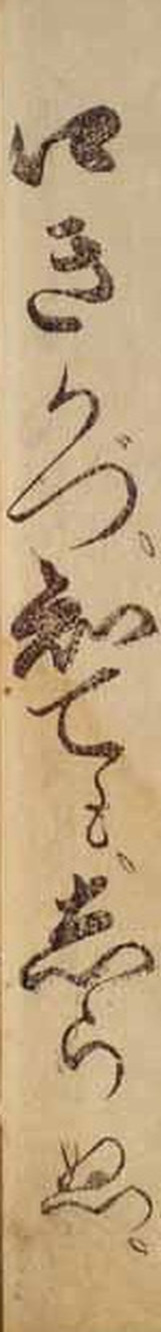口きかつ知ても。しらぬ。
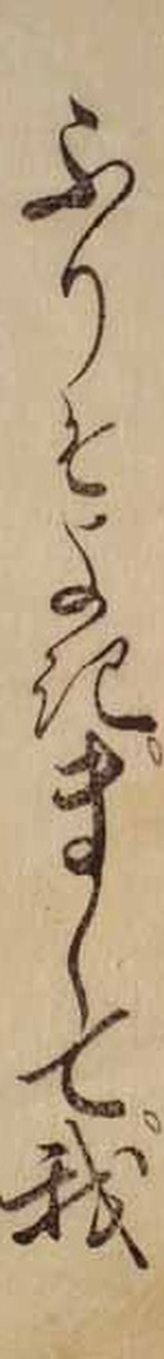ふりはよき。まして。我
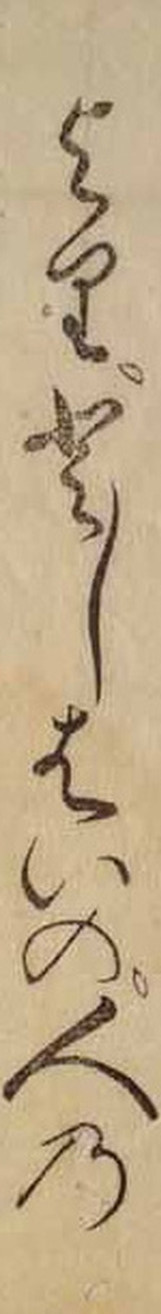より。としはいの。人の
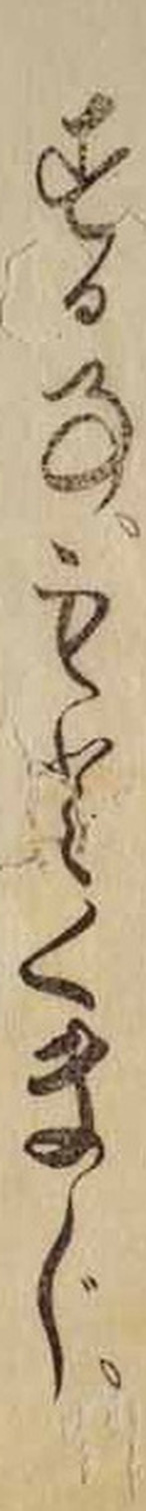する事。もとくまじ。
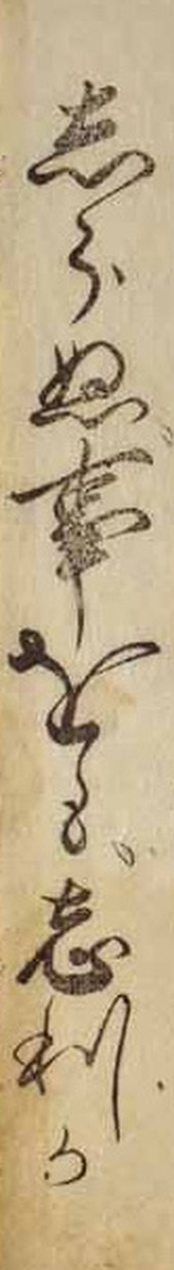しらぬ事をも。しりか

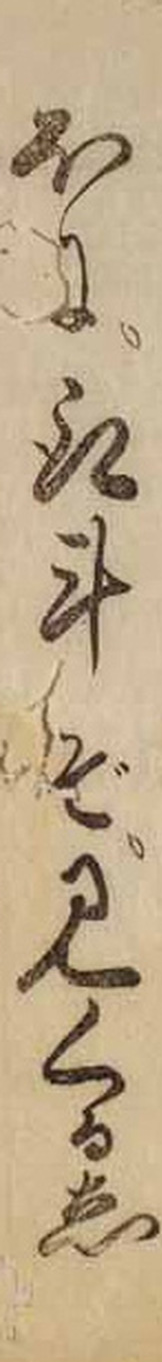ほに。取計ぞ。見くるし
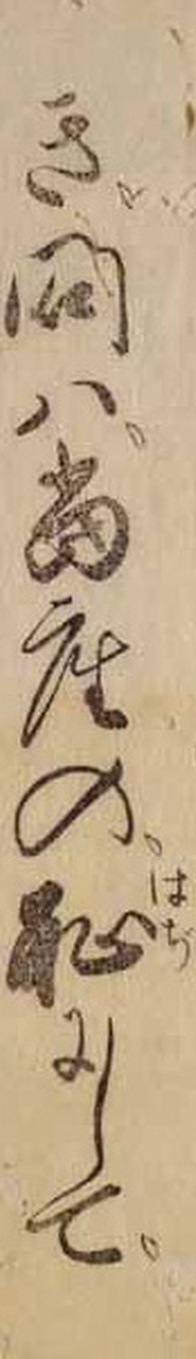き問は。当座の恥にして。
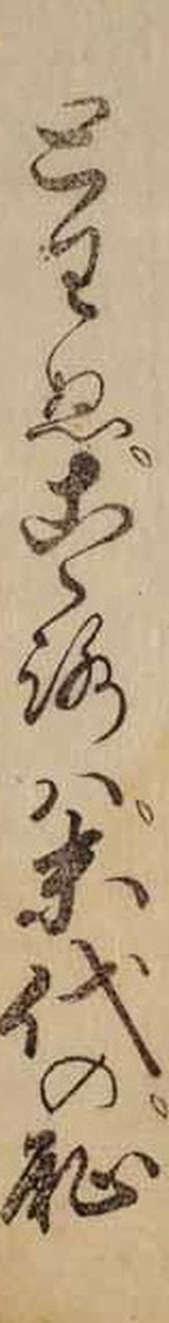とわぬ。こゝろは。末代の。恥
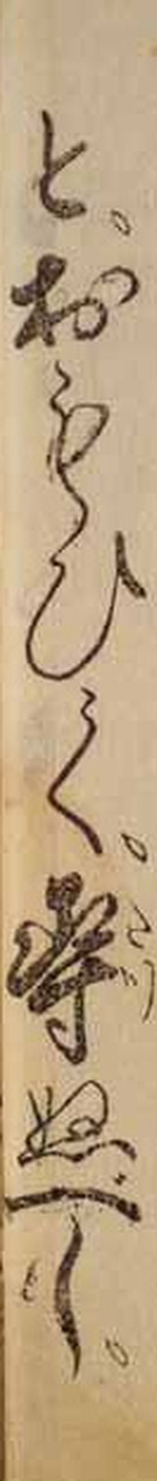と。おもひて。尋ぬべし。
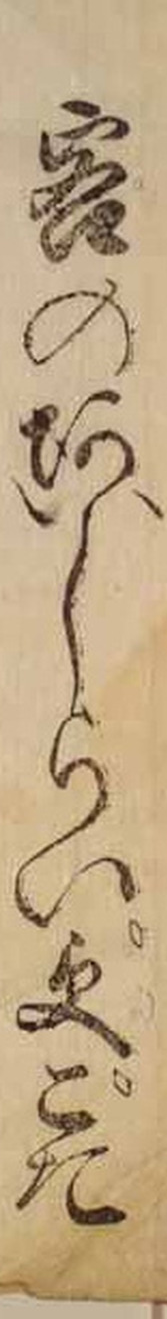客のあいしらい。受。こた
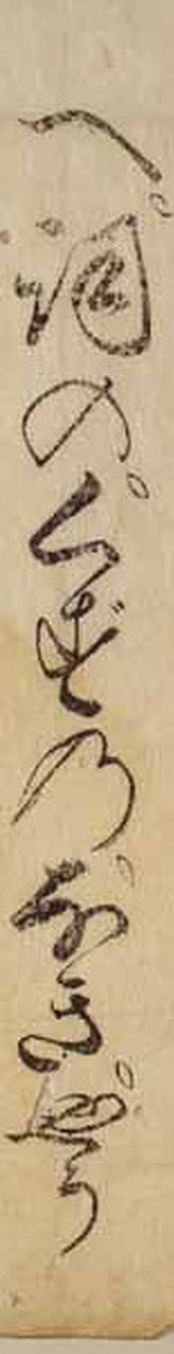へ。詞の。くずの。なき。やう
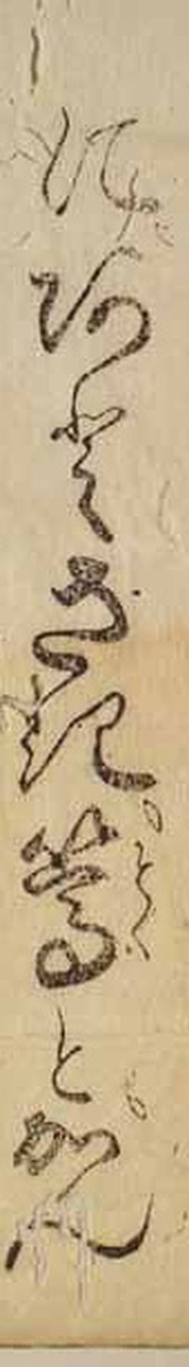にあとさき。篤とかん
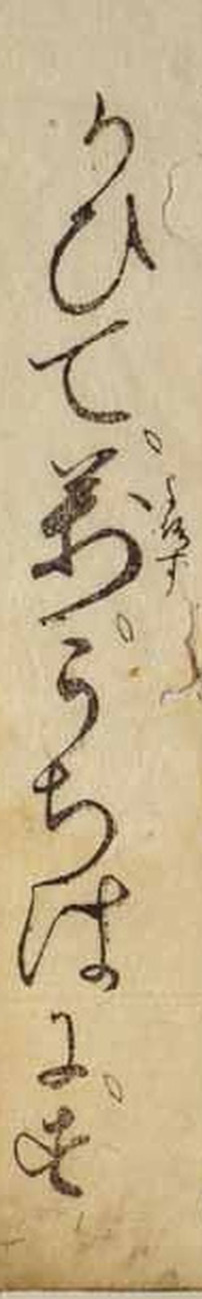かひて。万。うちはに。す

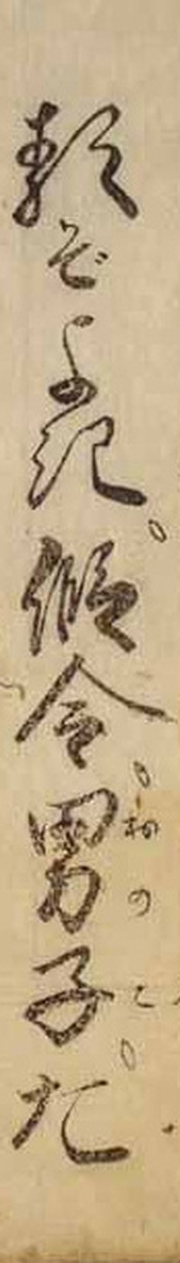るぞよき。縦令。男子。た
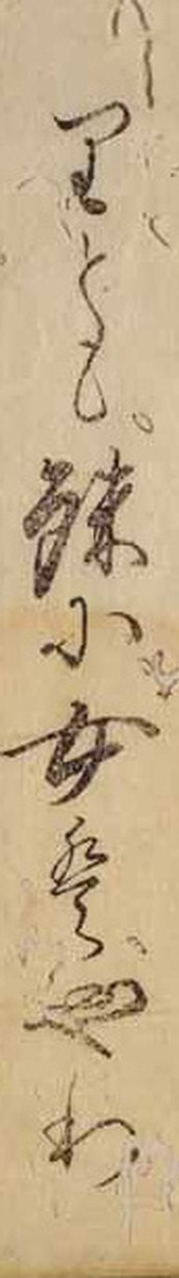りとも。殊に女はやわ
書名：寺子躾方
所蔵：東京学芸大学教育コンテンツアーカイブ
